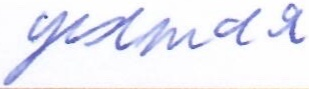усатая
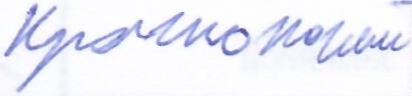красноногий
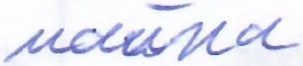майна
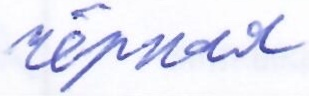чёрная
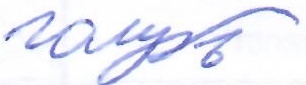голубь
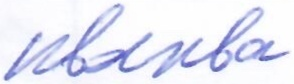кваква
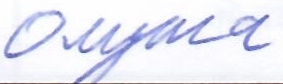олуша
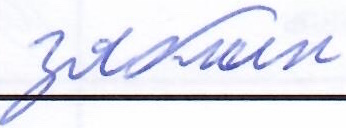зяблик
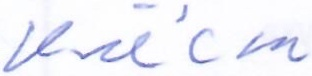клёст
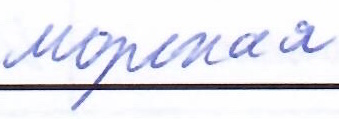морская
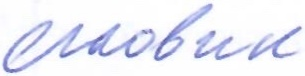еиовик
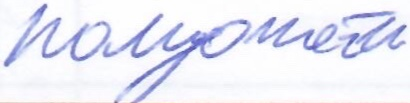полуошейн
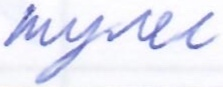тулес
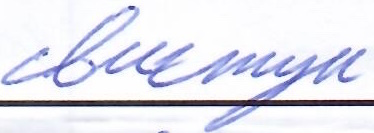свистун
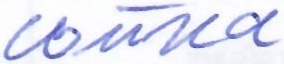сойка
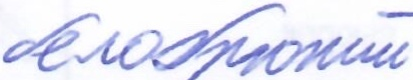белобрюхий
